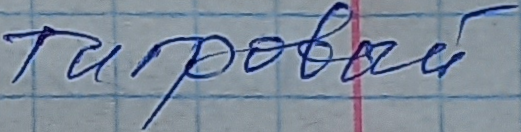тигровый
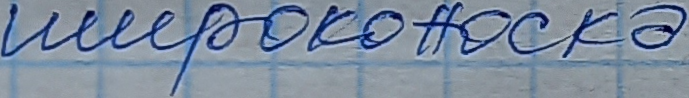широконоска
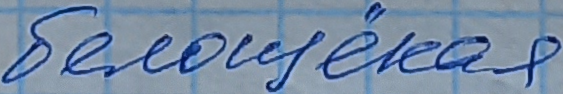белощёкая
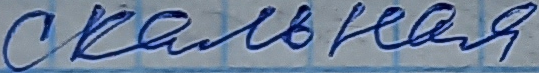скальная
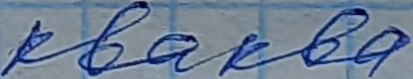кваква
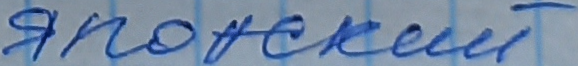японский
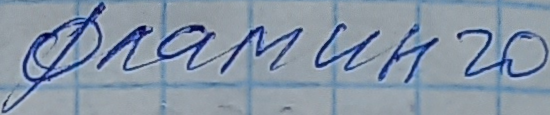фламинго
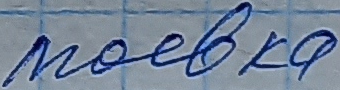моевка
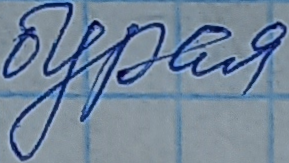бурая
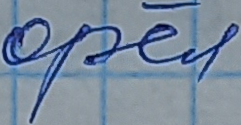орёл
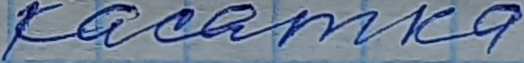касатка
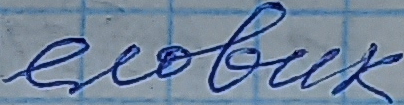еловик
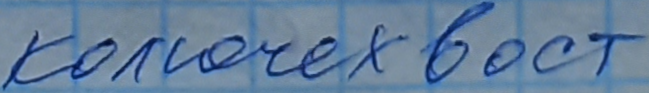колючехвост
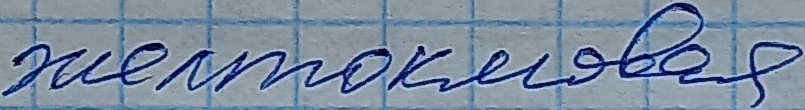желтоклювая
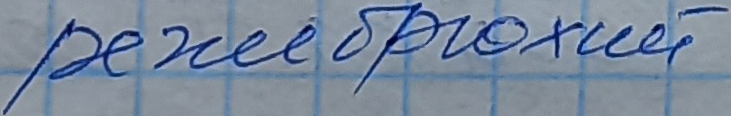режебрюхий
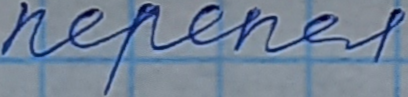перепел
